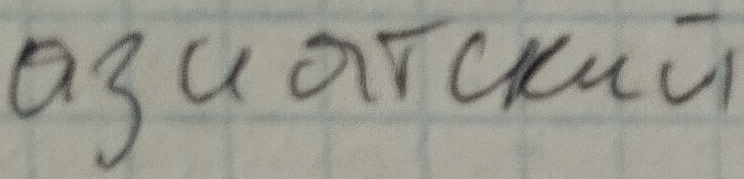азиатский
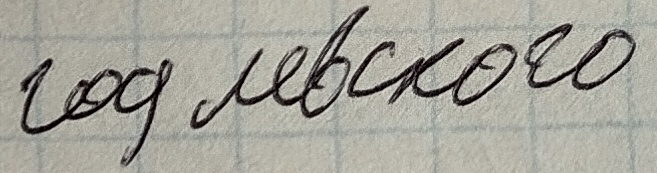год левского
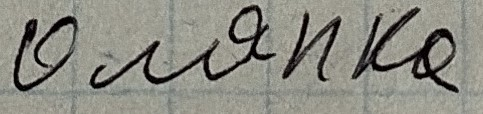оляпка
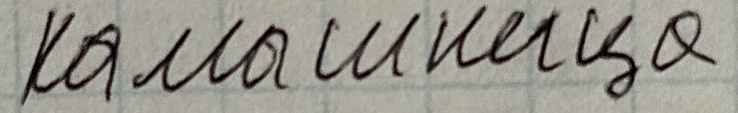камышница
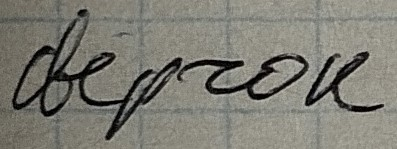сверчок
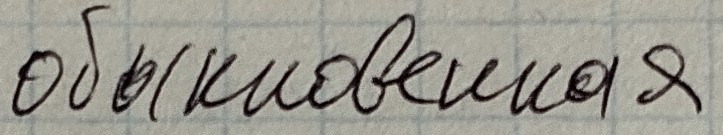обыкновенная
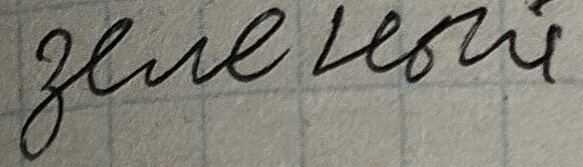зеленый
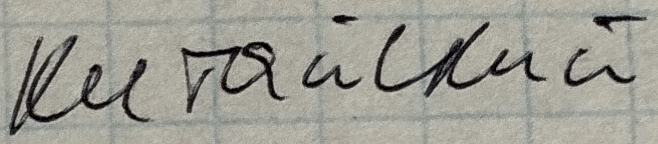китайский
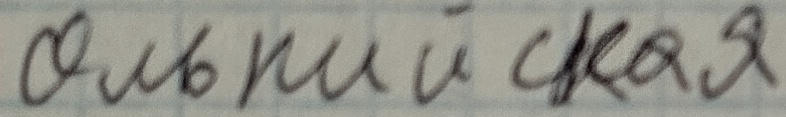альпийская
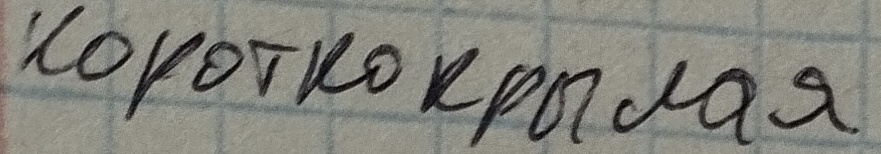короткокрылая
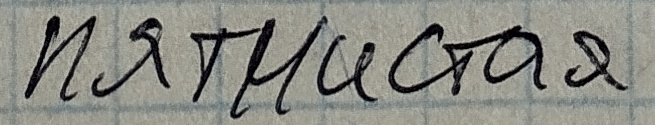пятнистая
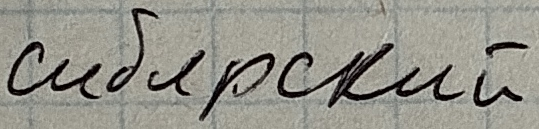сибирский
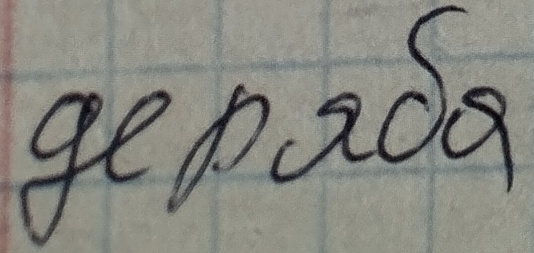деряба
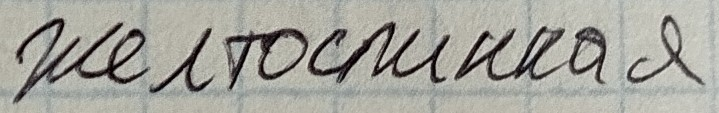желтоспинная
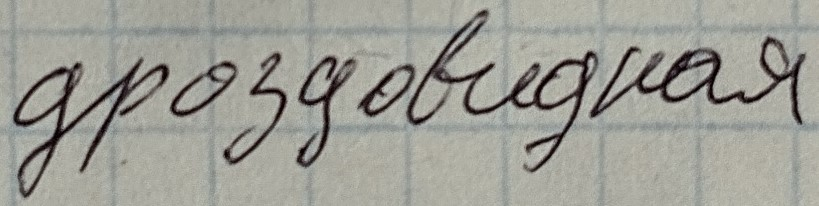дроздовидная
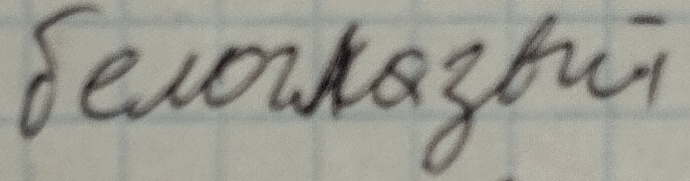белоглазый
